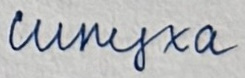сипуха
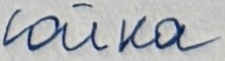сойка
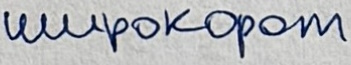широкорот
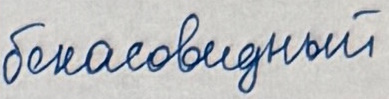бекасовидный
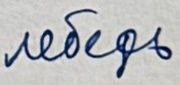лебедь
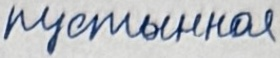пустынная
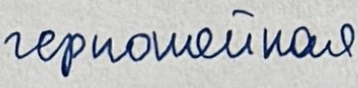черношейная
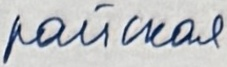райская
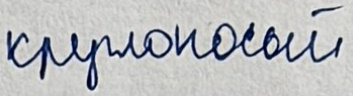круглоносый
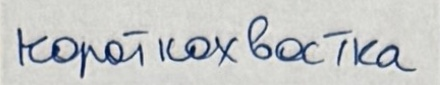короткохвостка
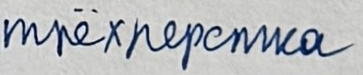тпёхперстка
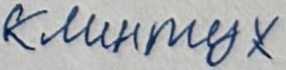клинтух
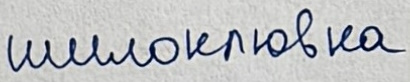шилоклювка
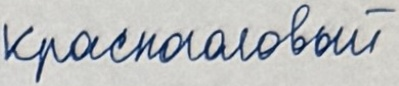красноголовый
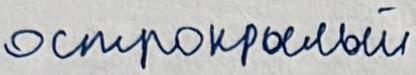острокрылый
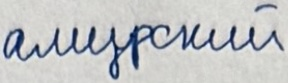амурский
